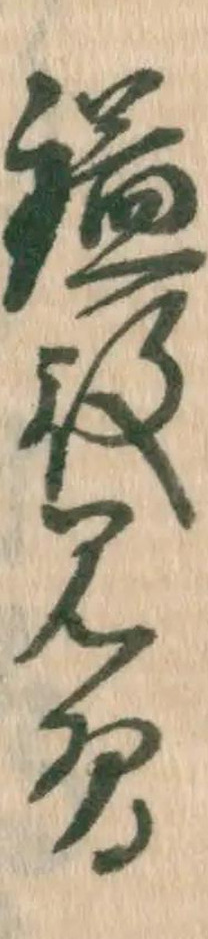鎰役見習
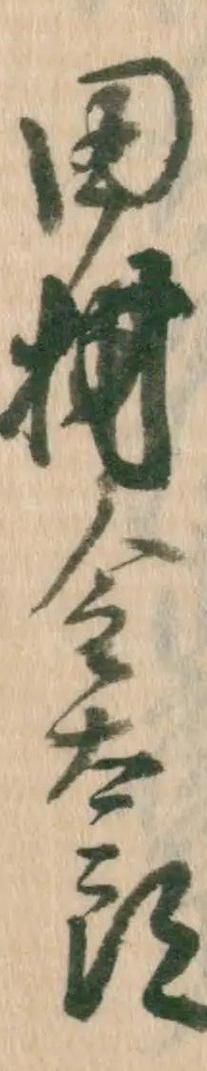田村金太郎
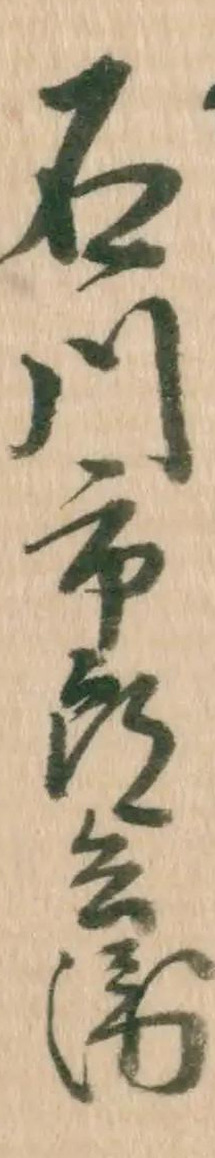石川市郎兵衛
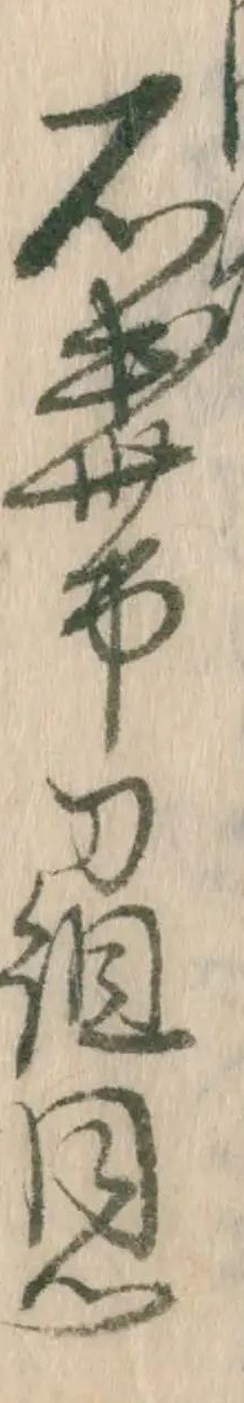石出帯刀組同心
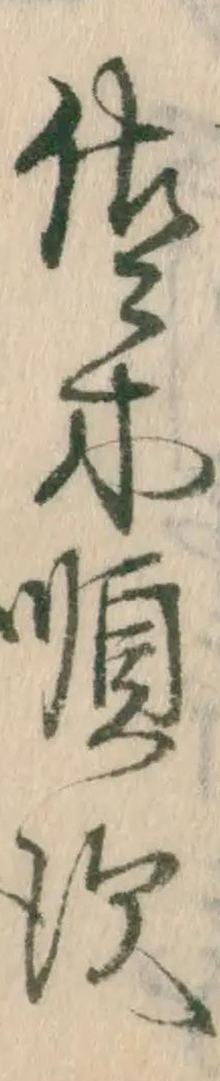佐々木順次
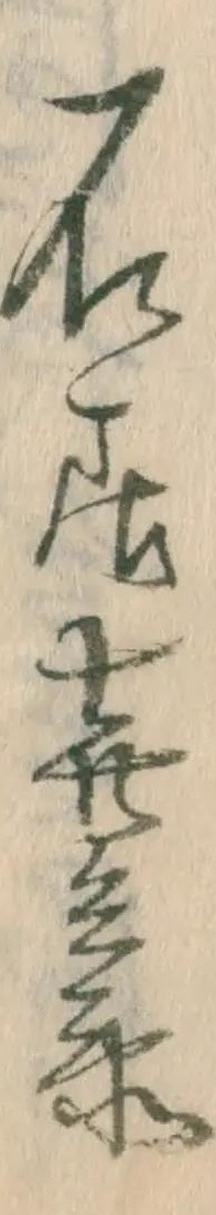石居喜兵衛
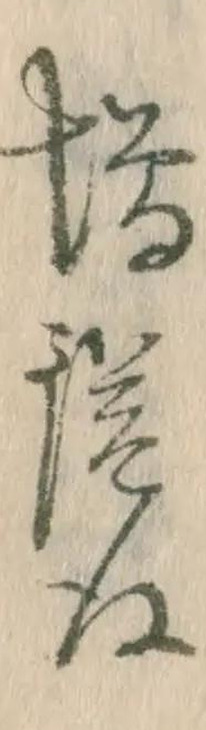増鎰役
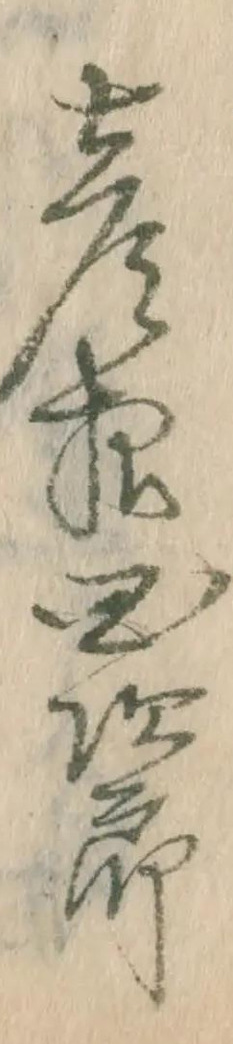彦根国次郎

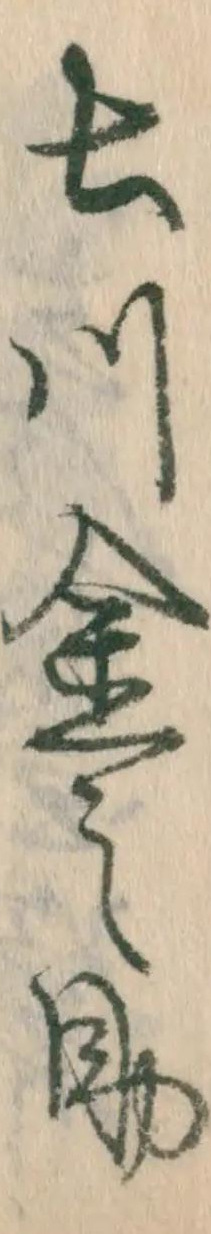大川金之助
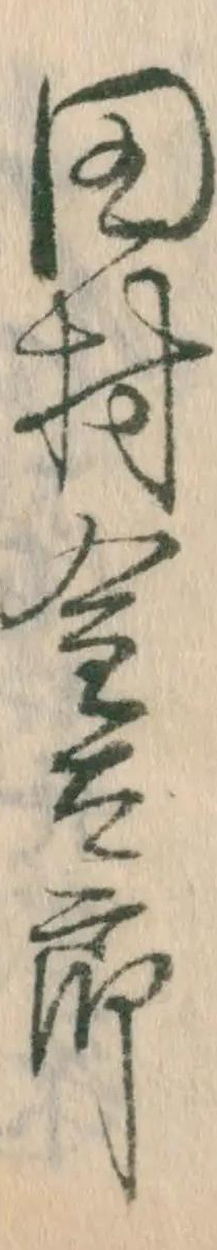田村金太郎
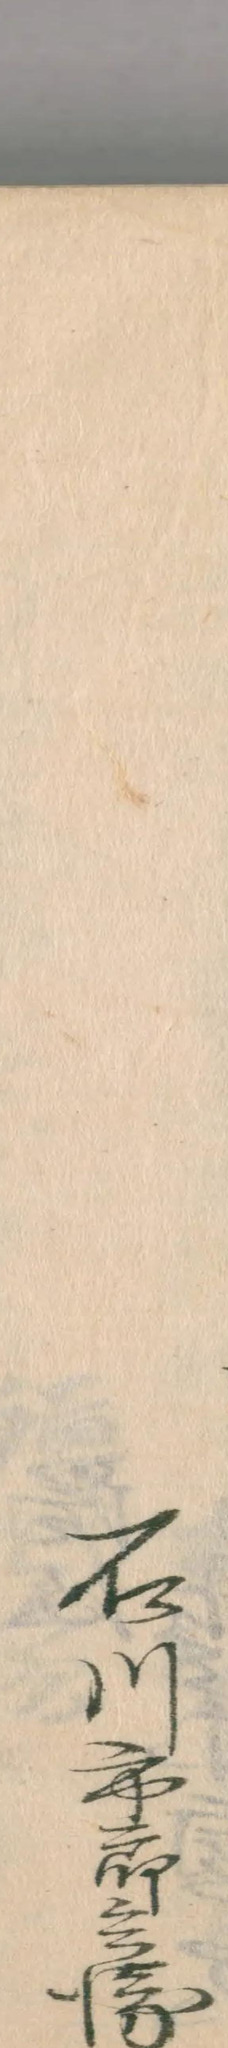石川市郎兵衛
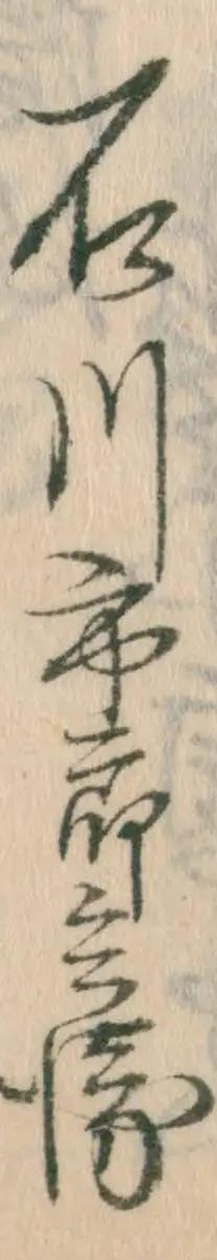石川市郎兵衛
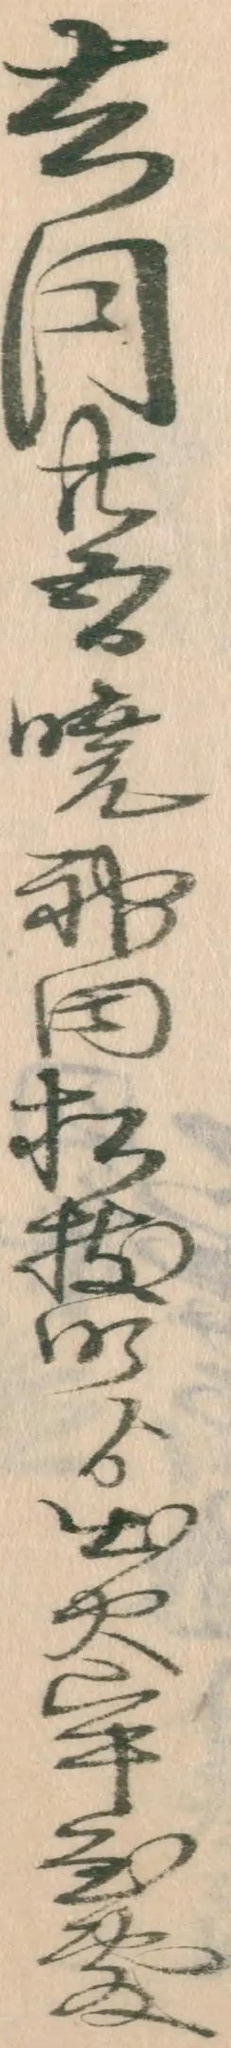去月廿五日暁神田松枝町ゟ出火牢屋敷
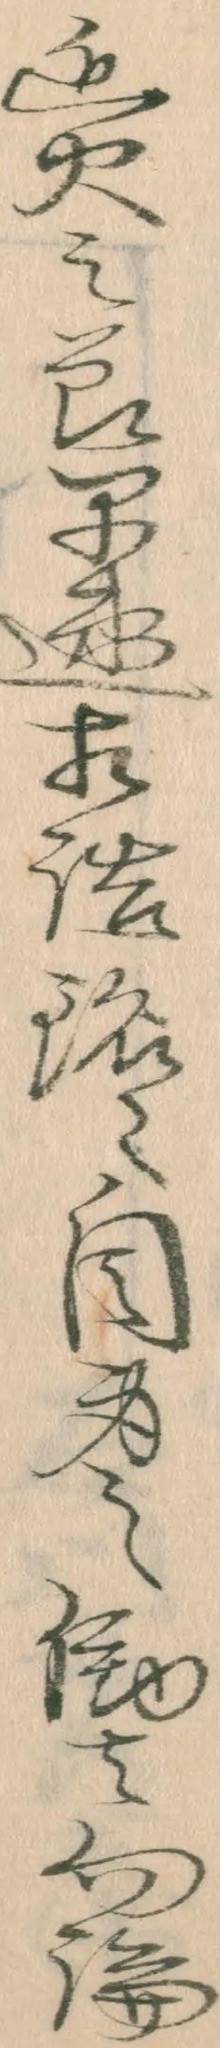近火之節早速相詰銘〻自身之働は勿論
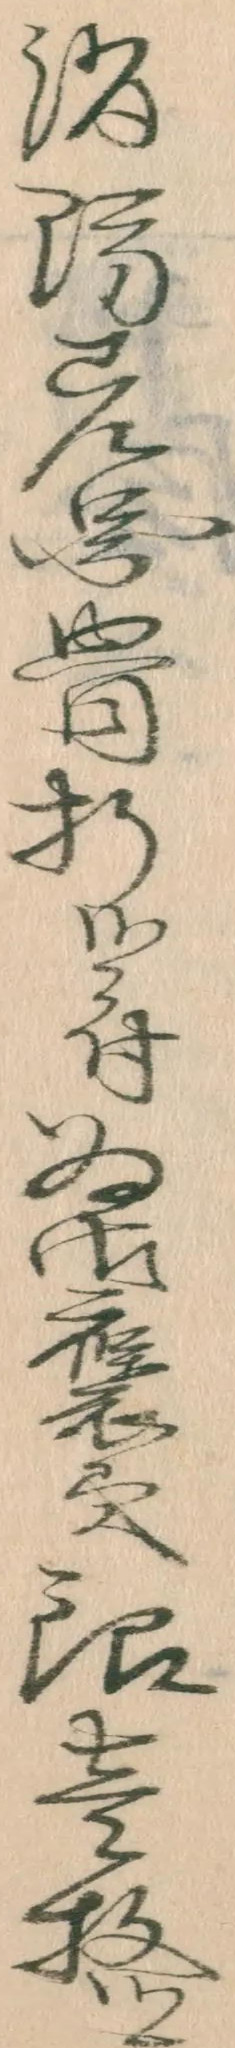消防指図骨折候ニ付為御褒美銀壱枚ツヽ
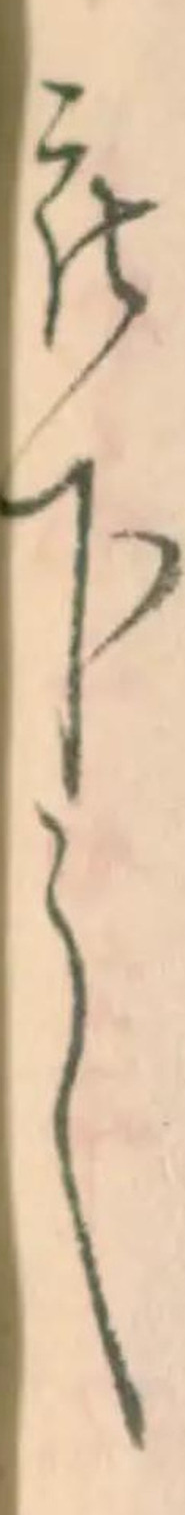被下之
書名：七十冊物類集 71巻. [44] 四十三 牢屋敷御普請御修覆地震ニ付骨折候牢屋掛御褒美之部
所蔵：国立国会図書館 National Diet Library, JAPAN
